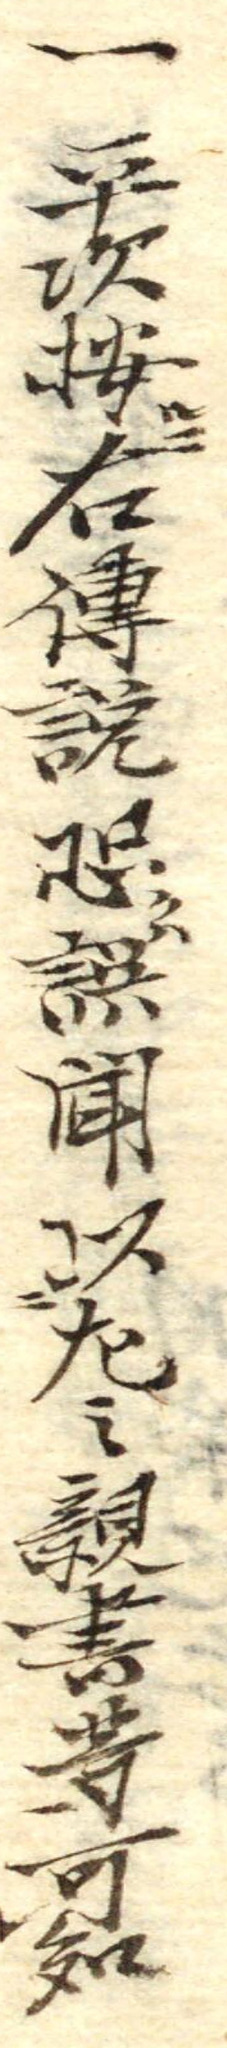一平次按るに右傳説恐くは誤聞以左之親書等可知
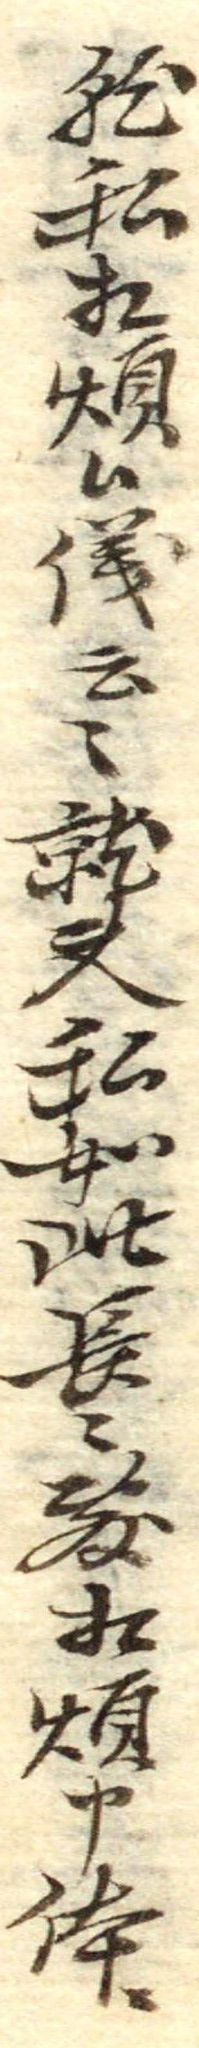就私相煩候儀云々就夫私如此の長々處相煩申体に
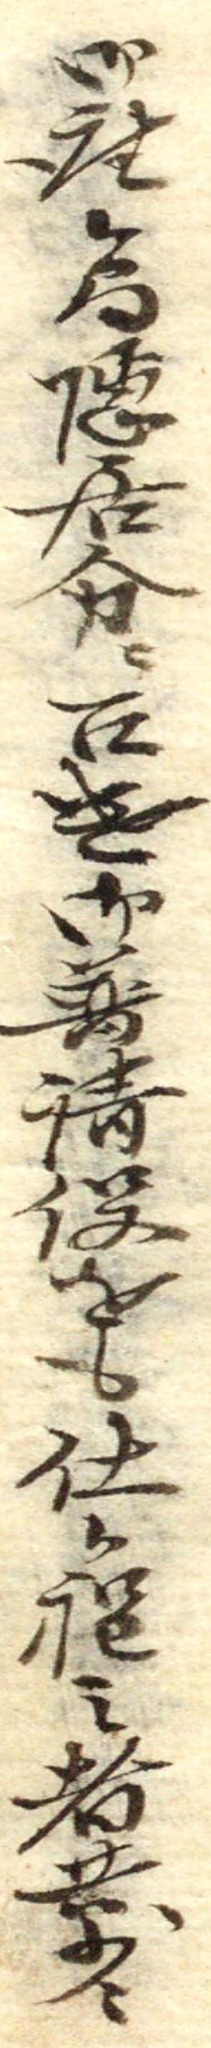御座候間隠居分に召遣御普請役をも仕候程之者共少々
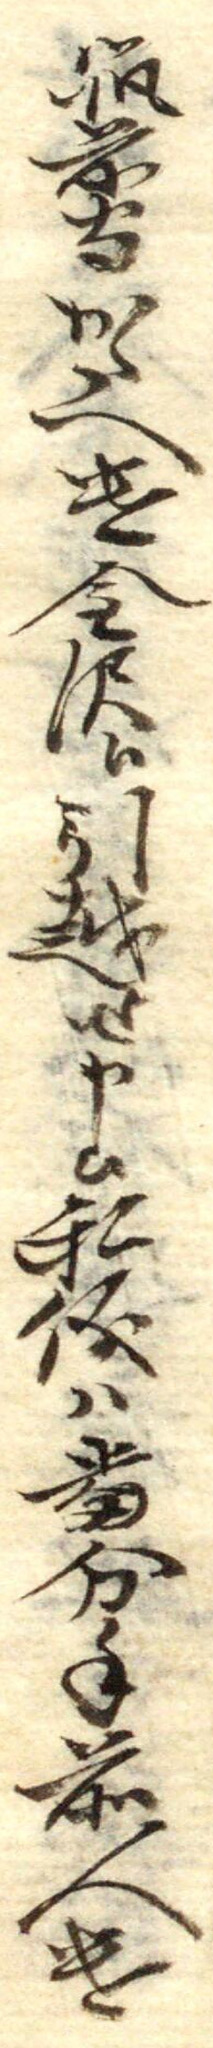筑前守かゝへ遣金沢江引越せ申候私儀は当分手前人遣

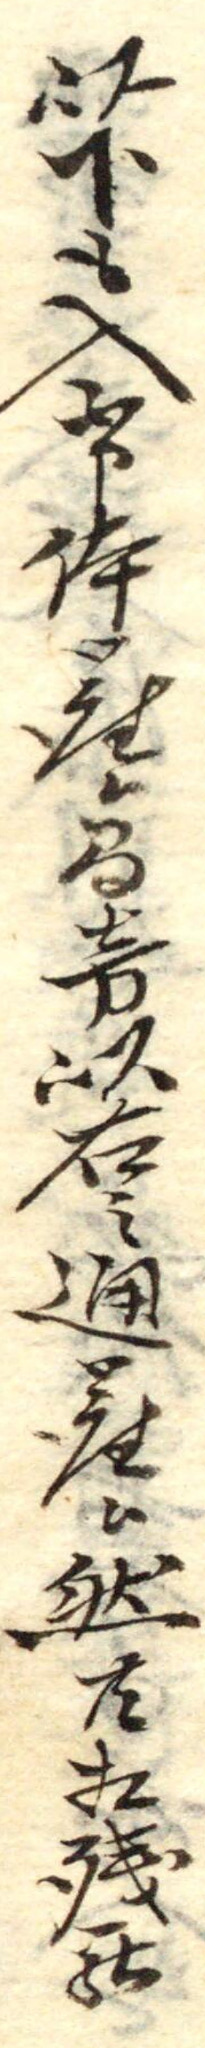以下も入ふ申体御座候間旁以右之通御座候然共相残罷
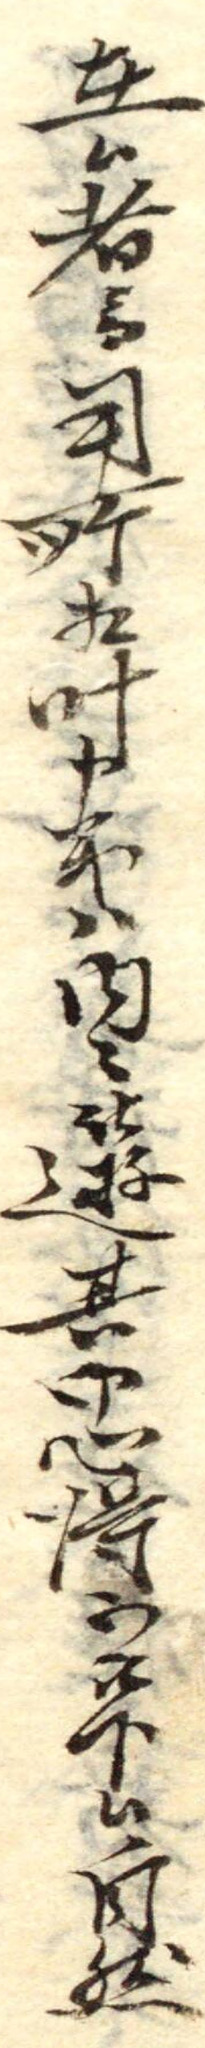在候者に而用所相叶申義は内々被遊其御心得可被下候自然
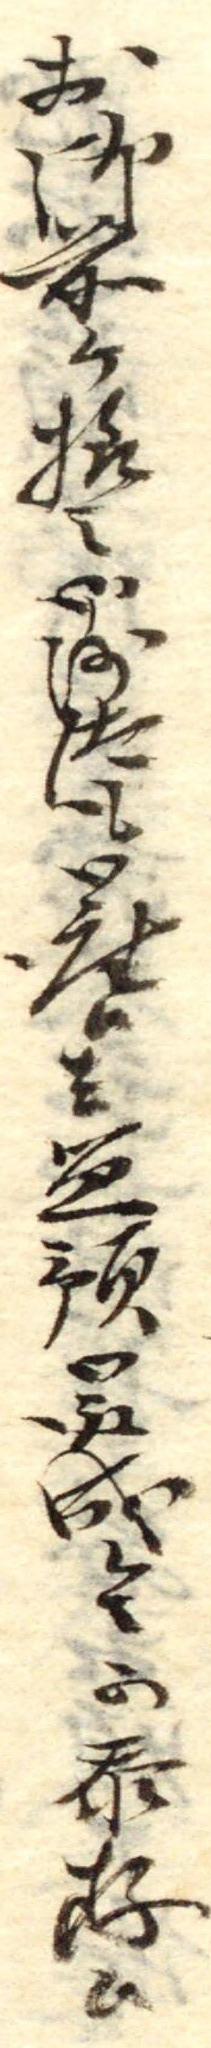お御前け様之御沙汰も御座候者冝預御取成候て可忝存候
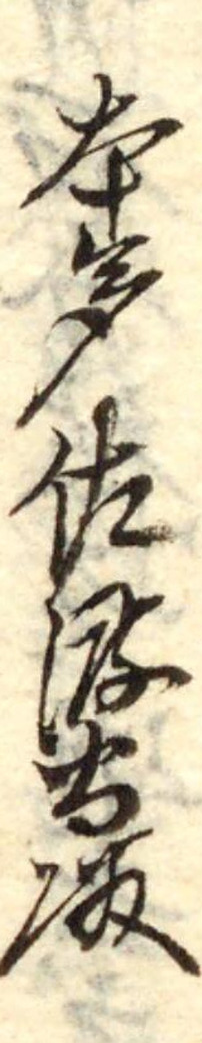本多佐渡守殿
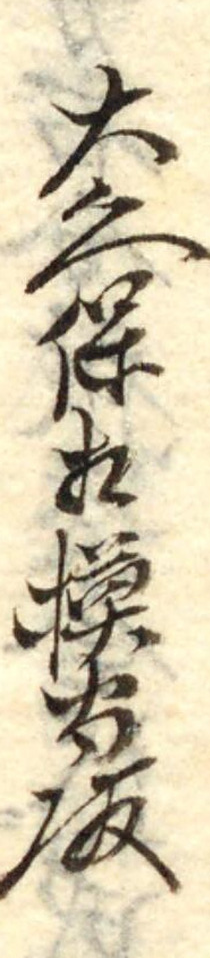大久保相模守殿
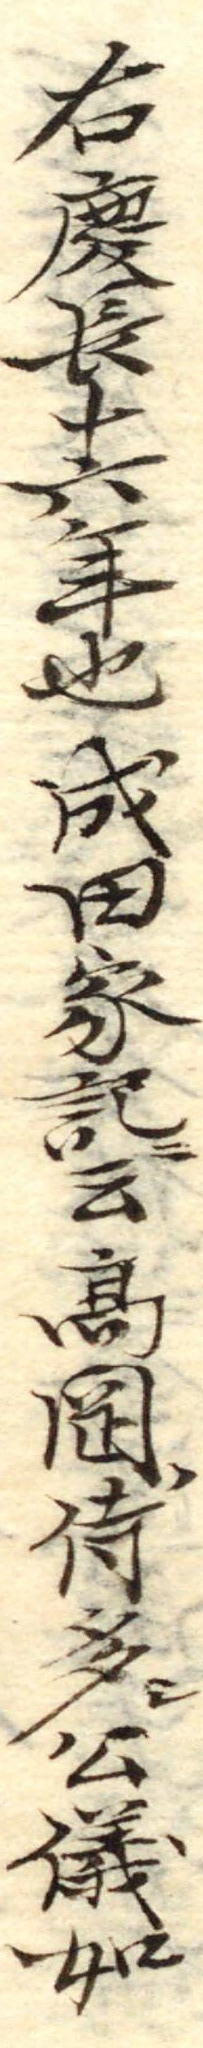右慶長十六年也成田家記に云高岡の侍多し公儀如
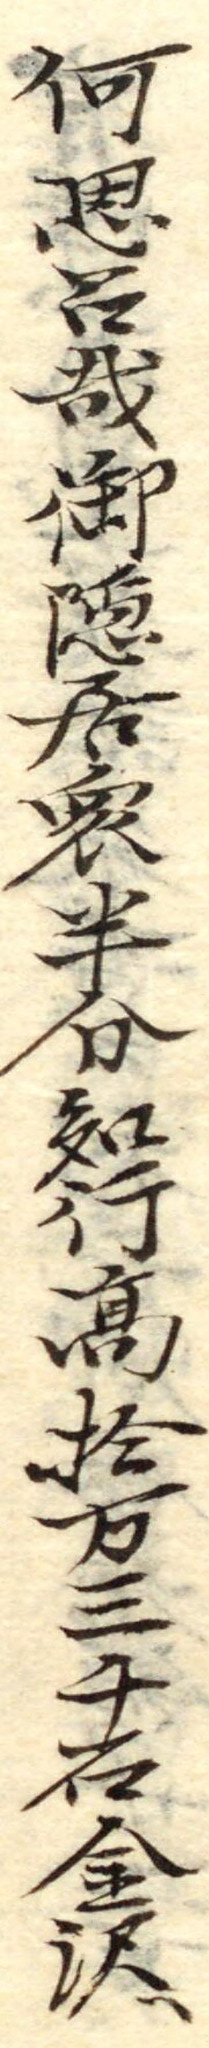何思召哉御隠居衆半分知行高拾万三千石金沢へ
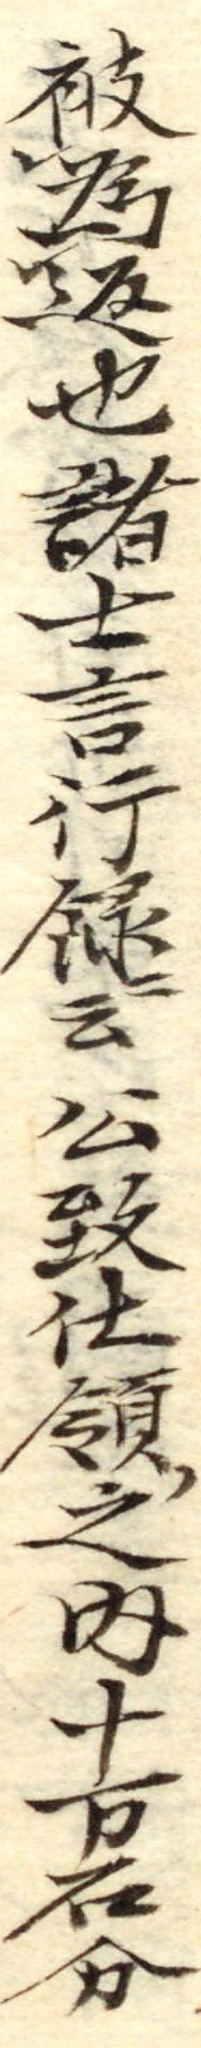被為返也諸士言行録に云公致仕領之内十万石分
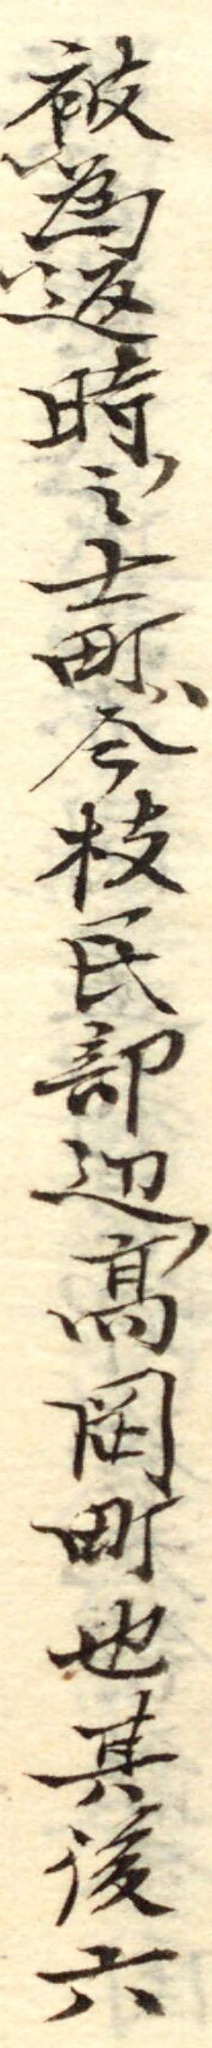被為返時之士町は今枝民部辺の高岡町也其後六
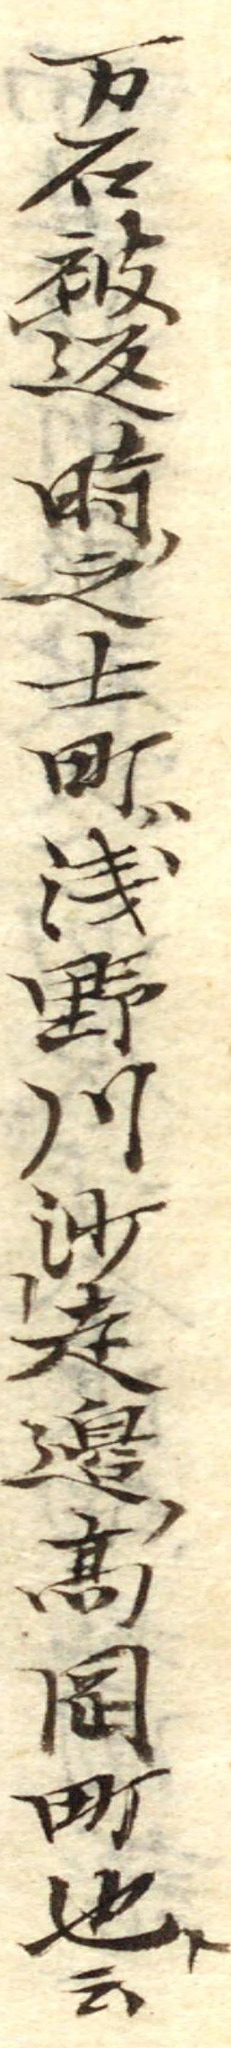万石被返時之士町は浅野川沙走邊の高岡町也と云
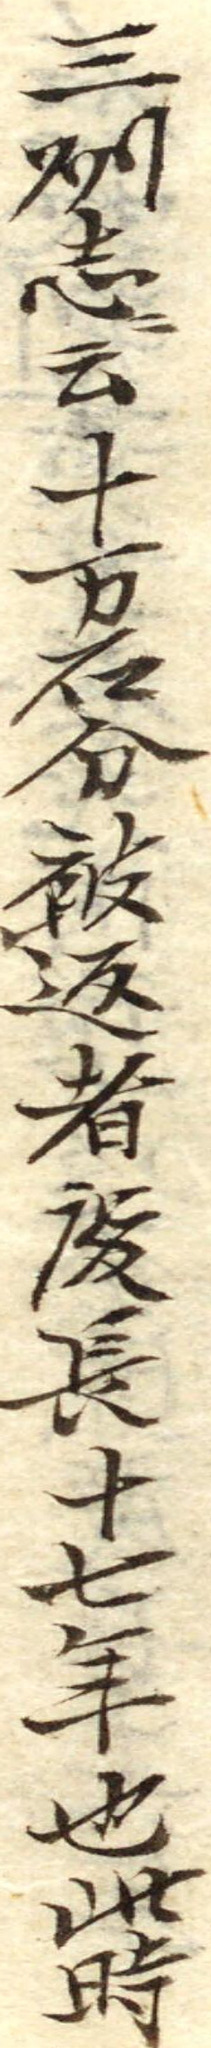三州志に云十万石分被返者慶長十七年也此時
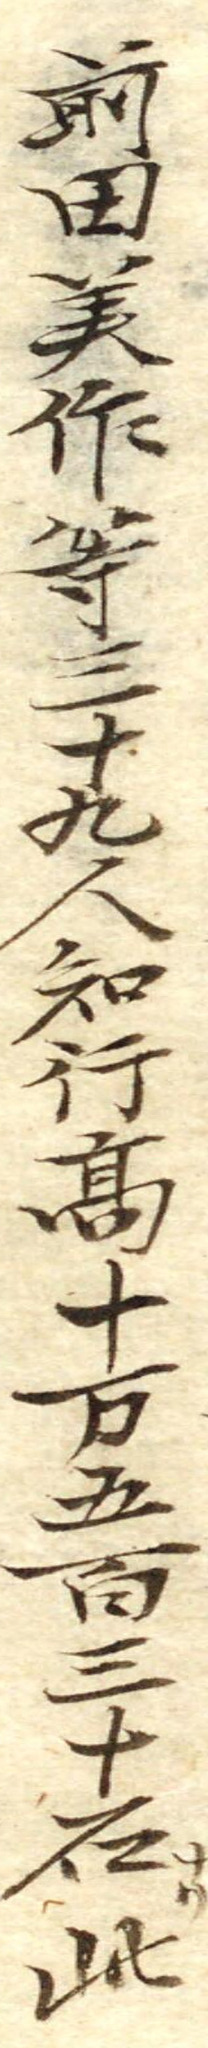前田美作等三十九人知行高十万五百三十石なり此
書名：前田家封国証書集録
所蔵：Ishikawa Prefectural Library
